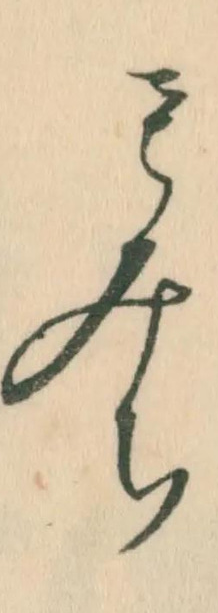もみち
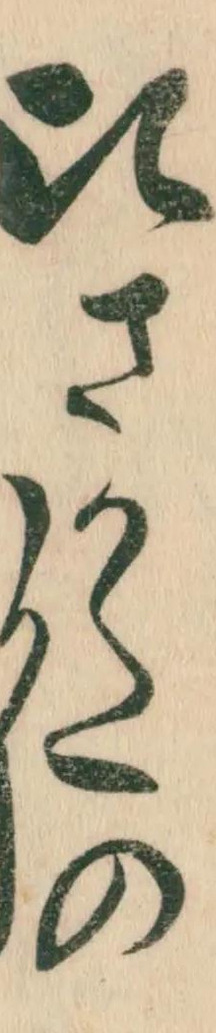ひさかたの
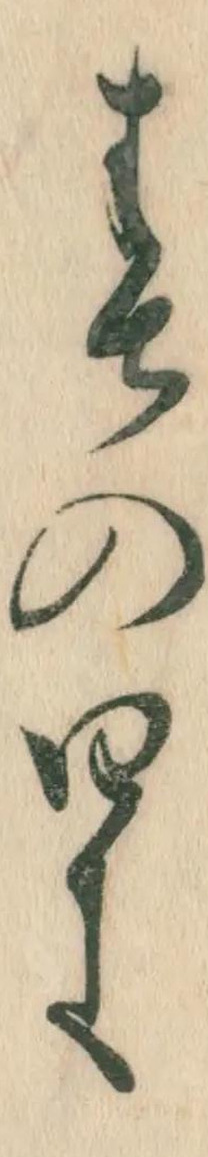春の日に
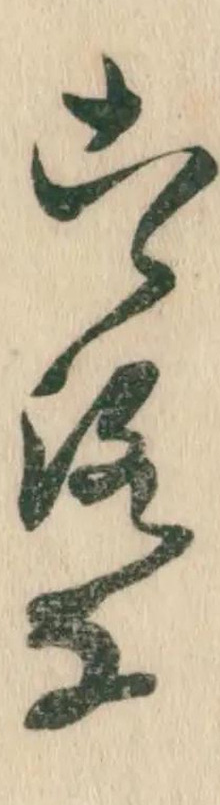こゝろな

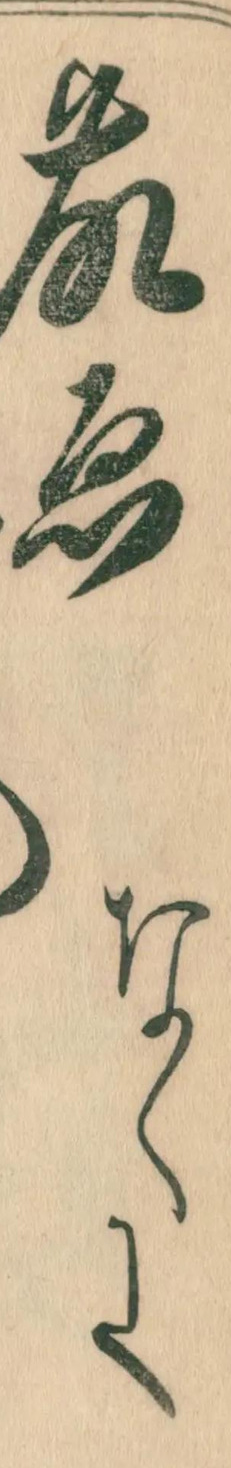藤原なくに
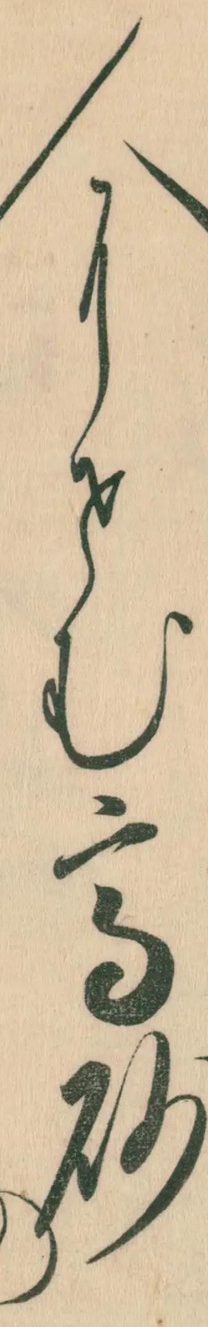人にせむ高砂
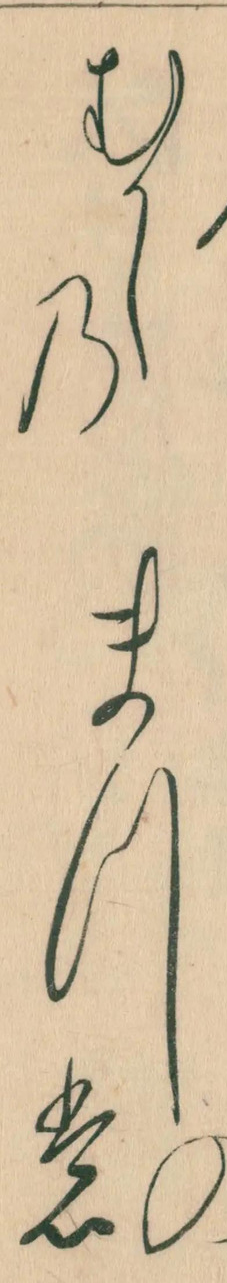むかしまつ
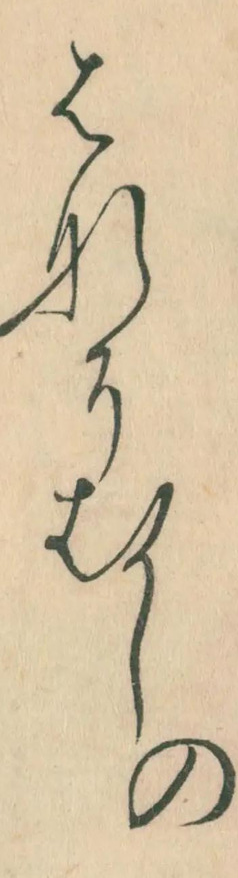はなそむかしの
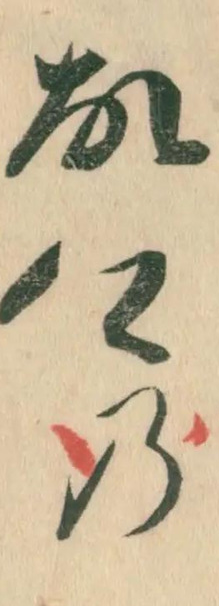故郷の
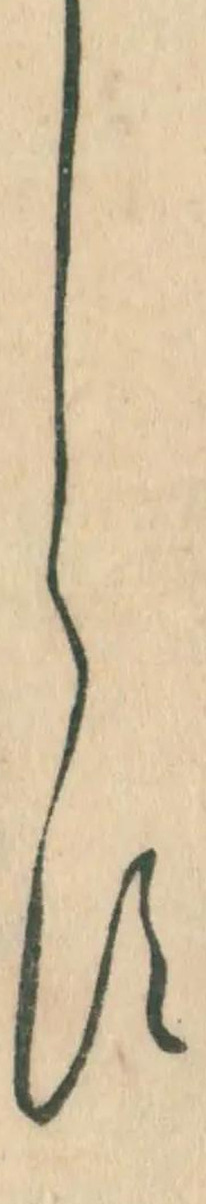しらす
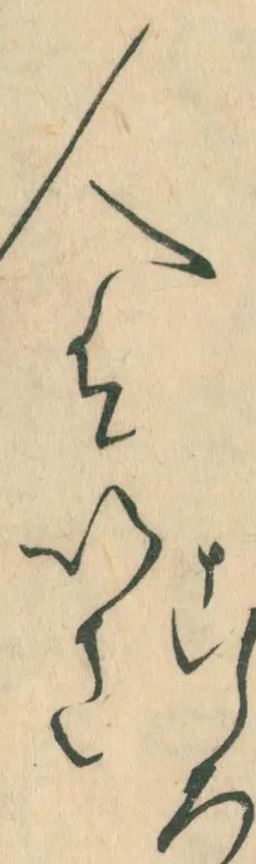人はいさ
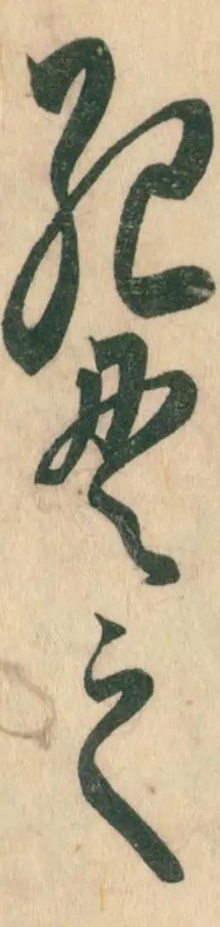紀貫之

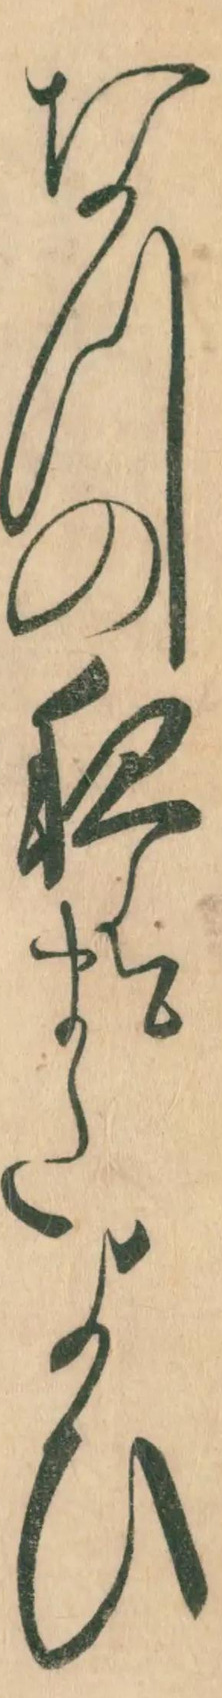なつの夜はまたよひ
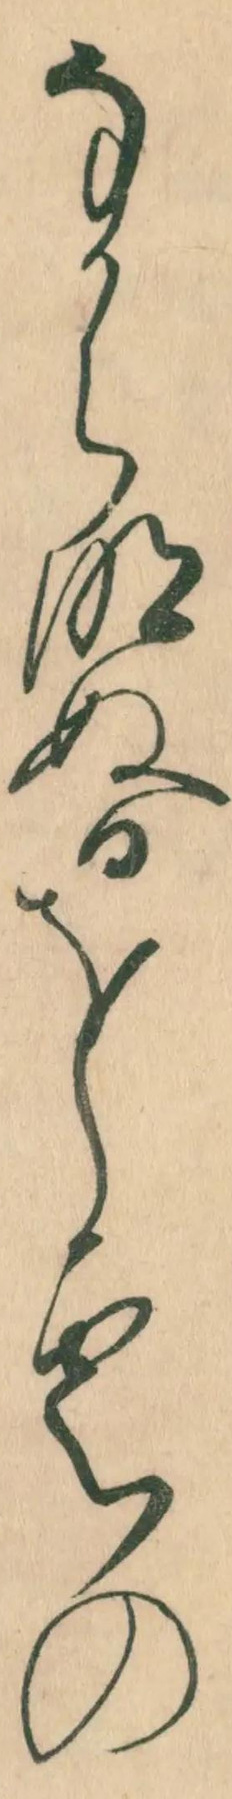なから明ぬるを雲の
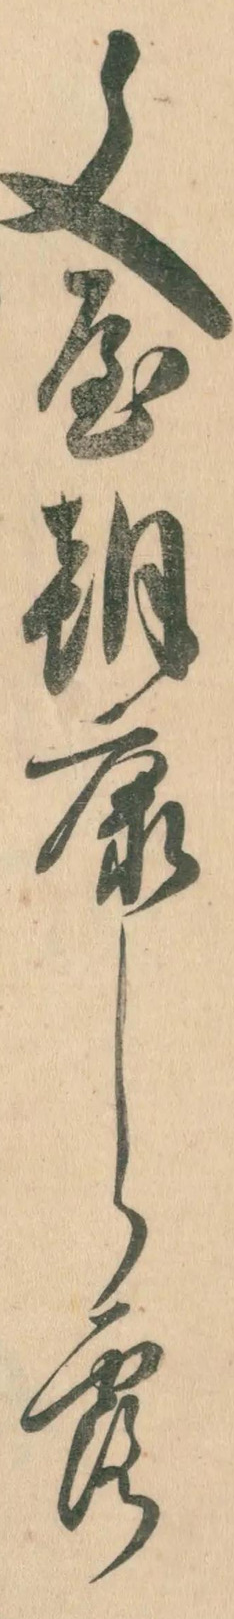文屋朝康しら露
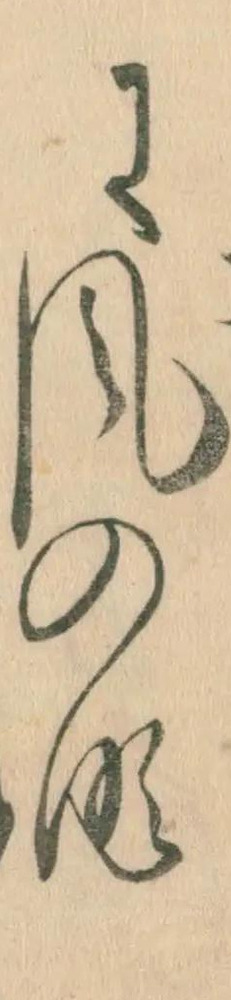に風の吹
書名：錦百人一首あつま織
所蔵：国立国会図書館 National Diet Library, JAPAN
